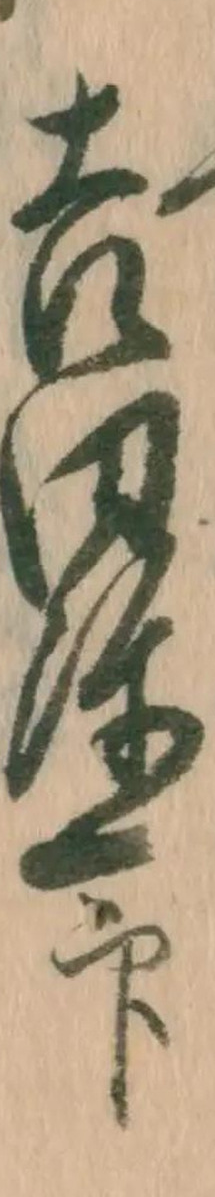吉田弥一印
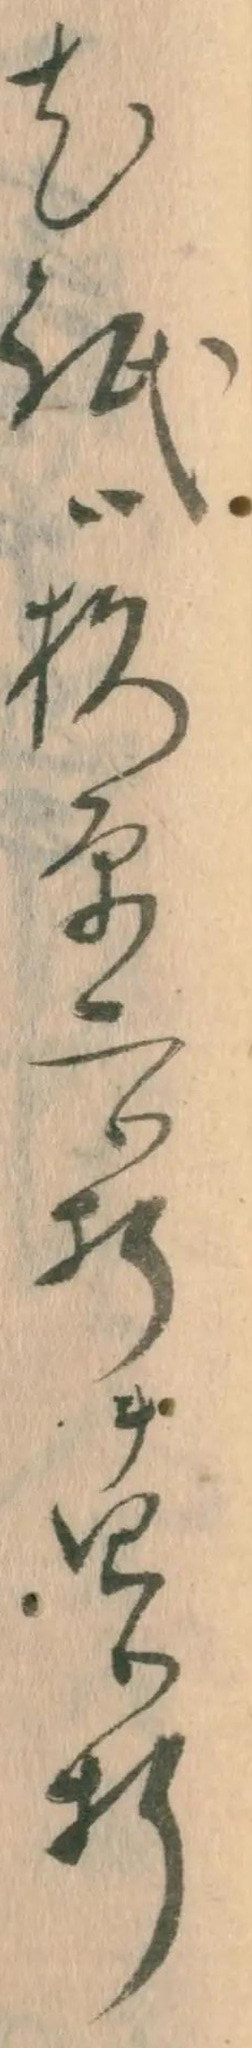尤紙ハ杉原二ツ折ヲ四ツ折
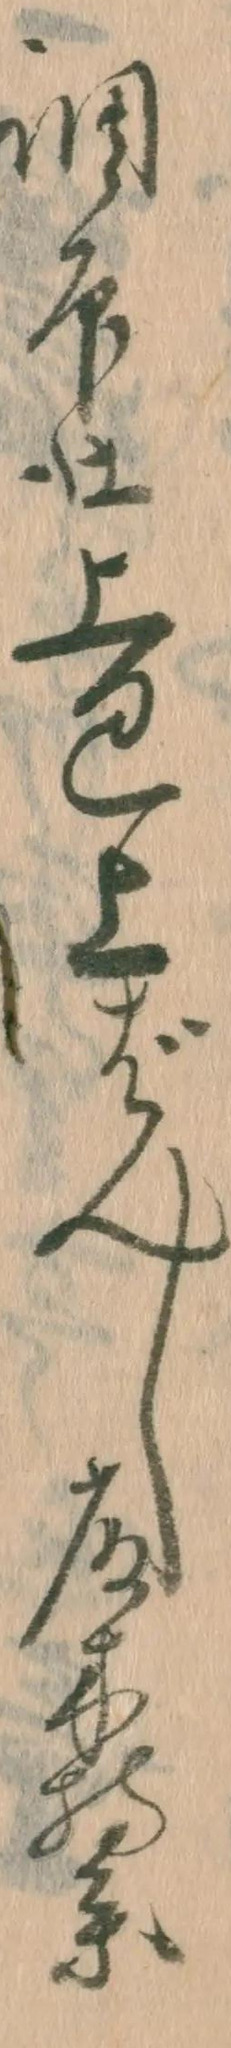調印仕上包上ばんし藤木持参
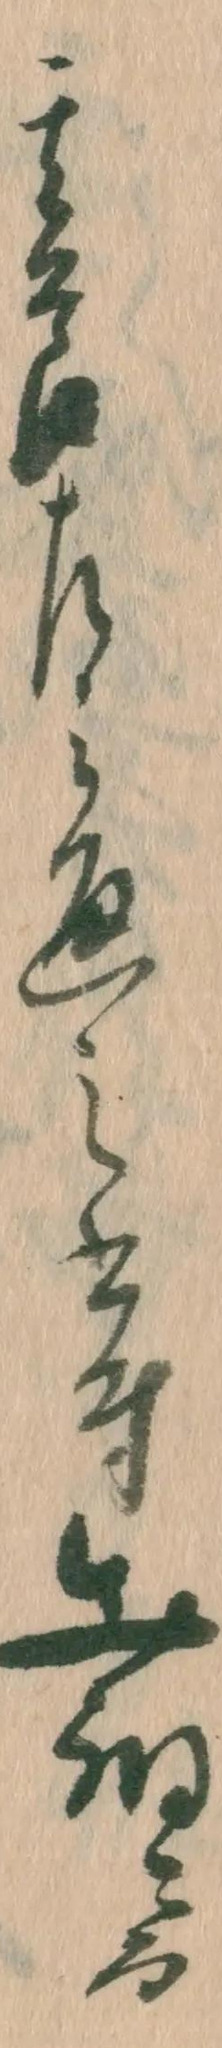其節左之通之書付出納ニ而
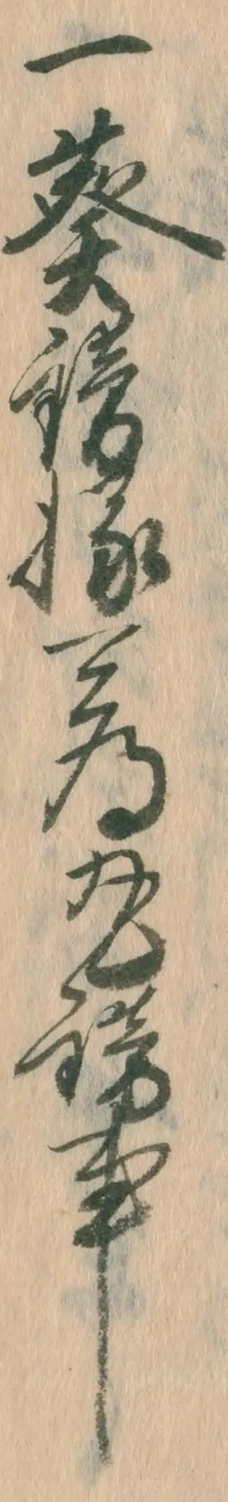一葵餝様可為丸錺事

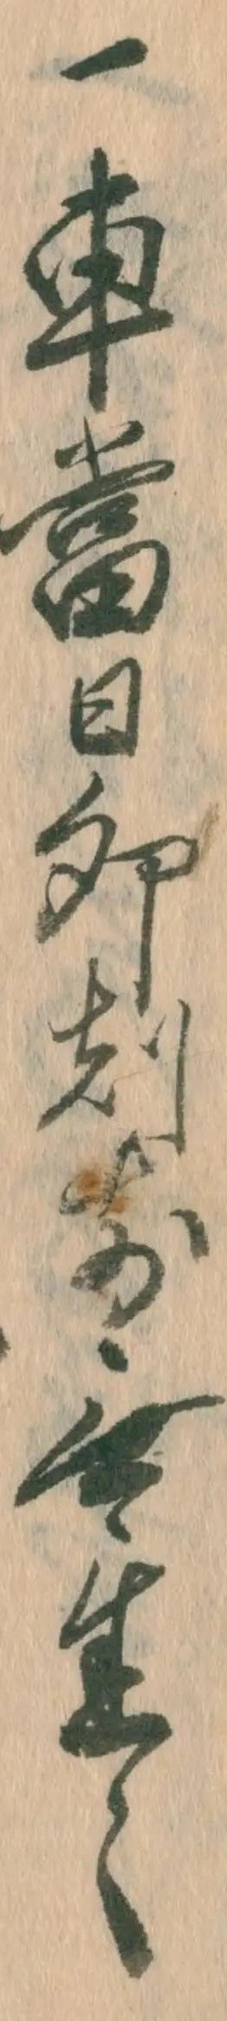一車当日卯刻前無遅々
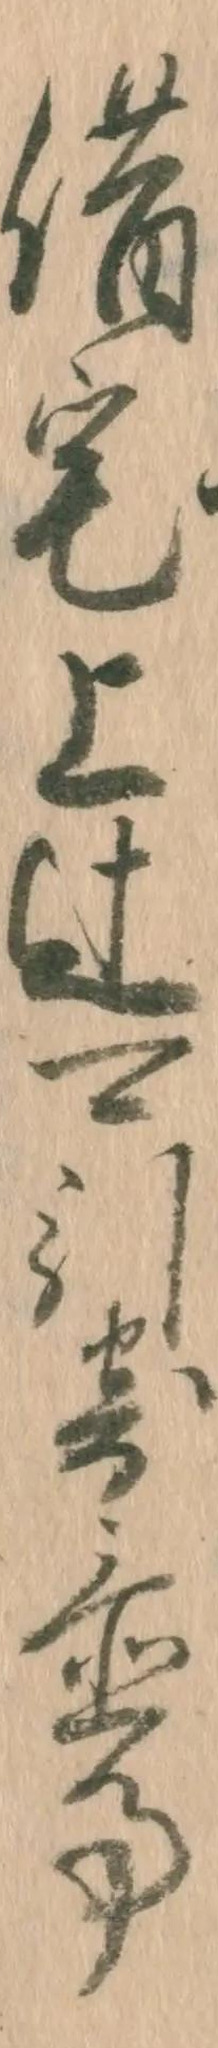借宅上辻可引寄置事
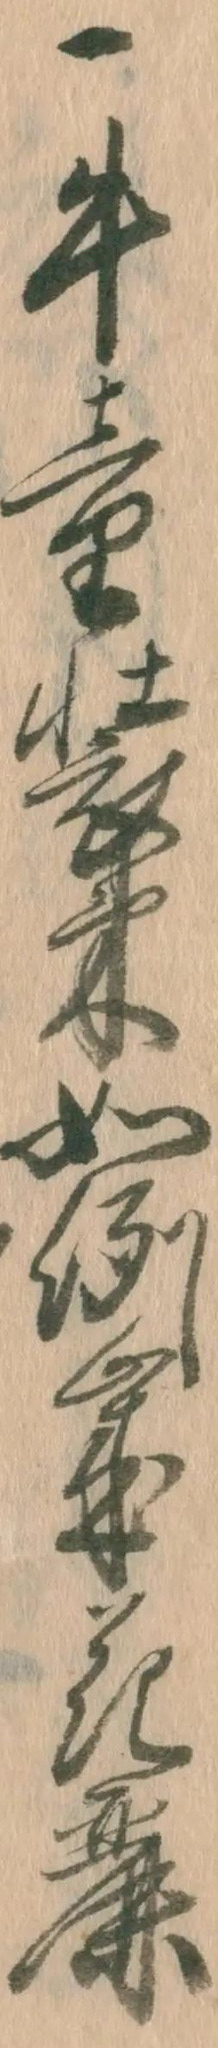一牛童装束如例歳花麗
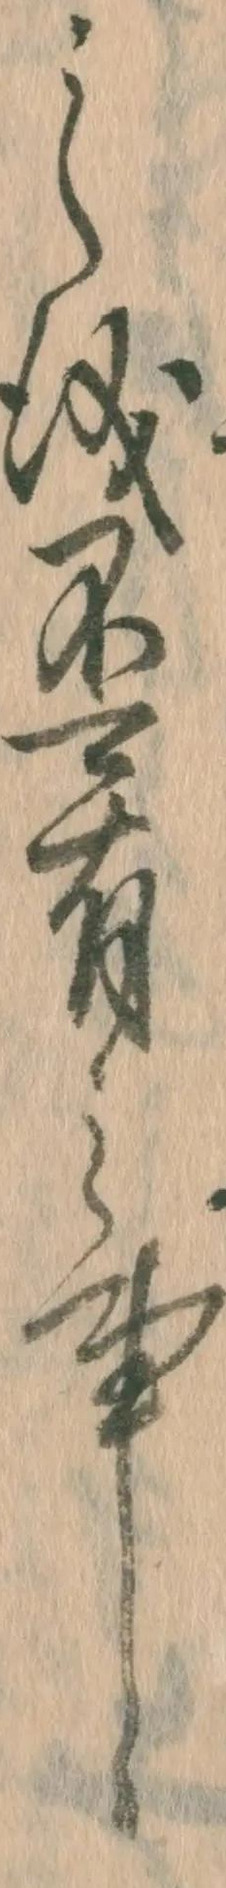之儀不可有之事
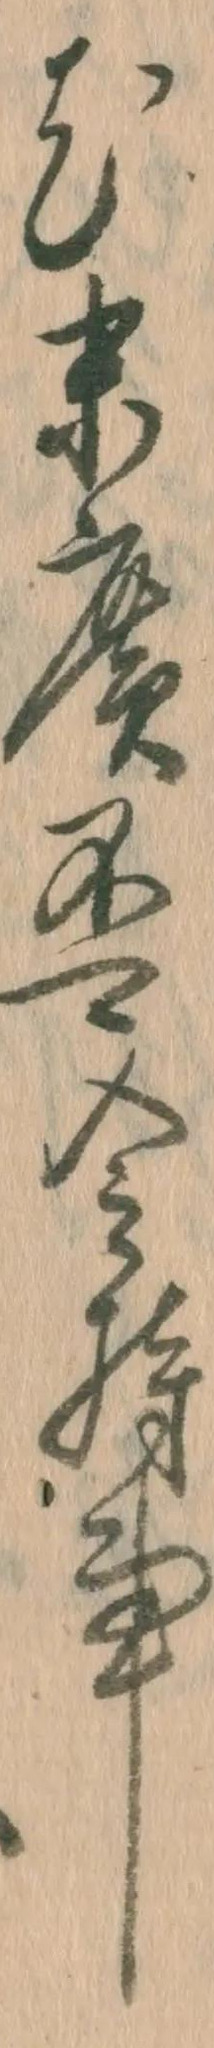尤末広不可令持事
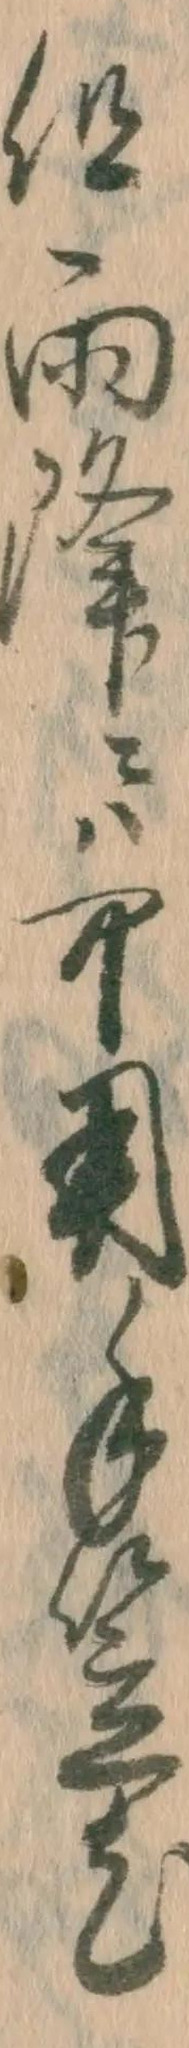但雨降ニハ可用手笠尤
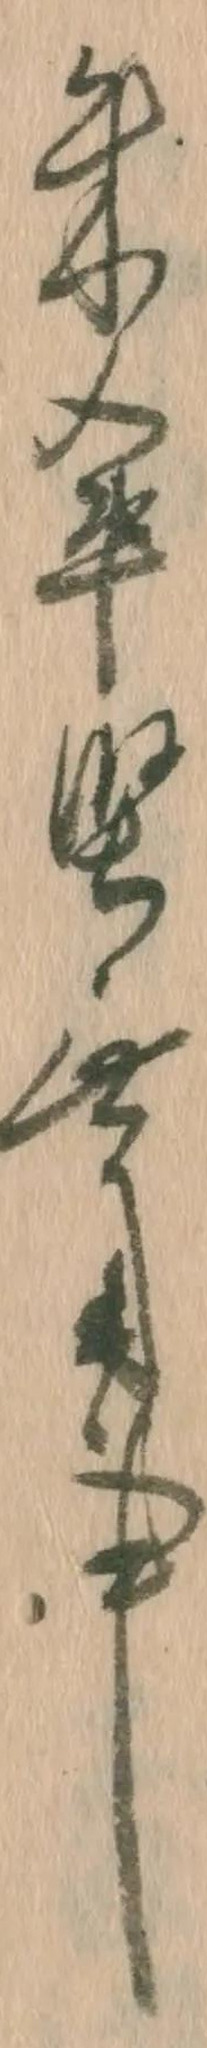朱傘堅無用事
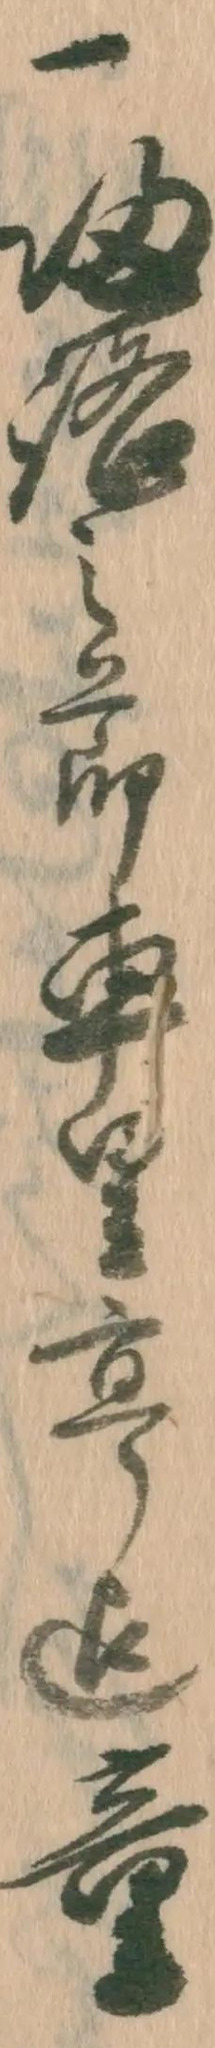一帰路之節車里亭迄童
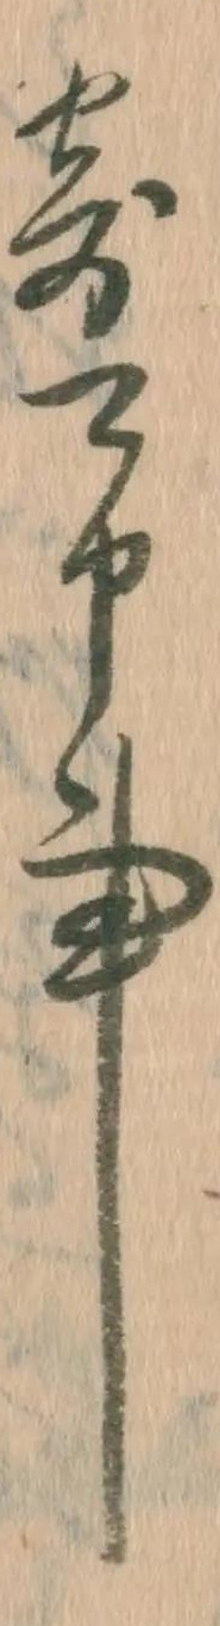寄可申事
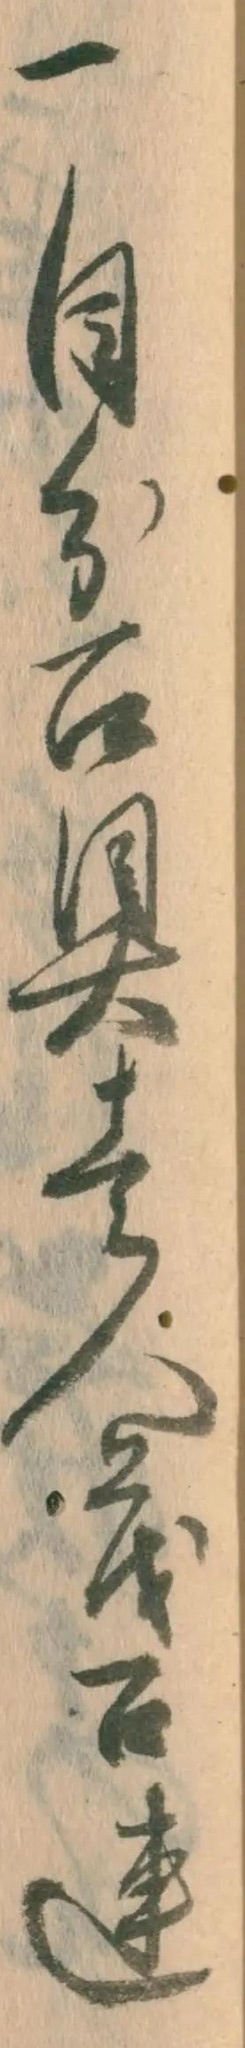一自分召具壱人も召連
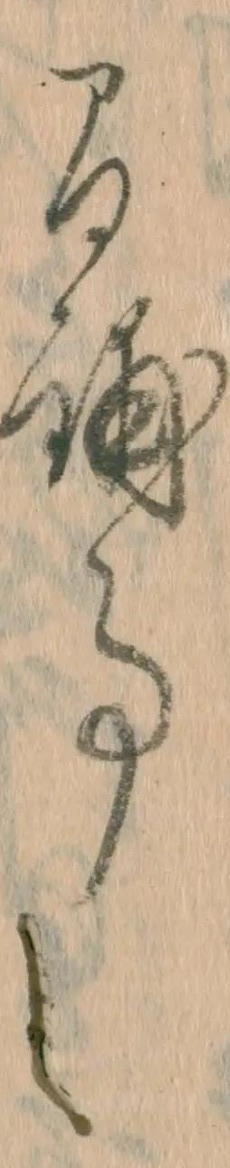間鋪事
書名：賀茂社記録. 第61冊
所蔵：国立国会図書館 National Diet Library, JAPAN
